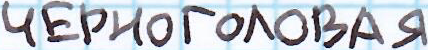черноголовая
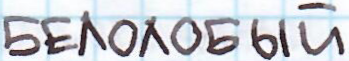белолобый
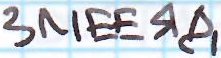змееяд
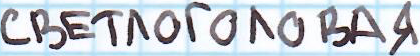светлоголовая
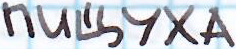пищуха
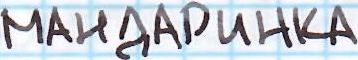мандаринка
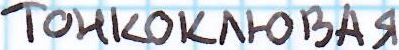тонкоклювая
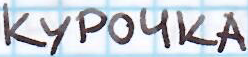курочка
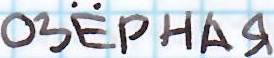озёрная
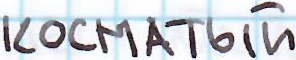косматый
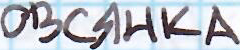овсянка
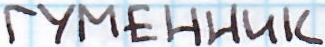гуменник
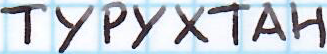турухтан
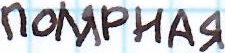полярная
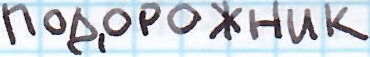подорожник
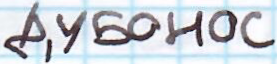дубонос
